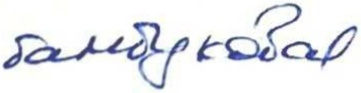бамбуковая
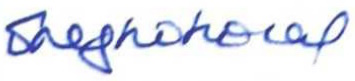бледноногая
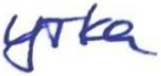утка
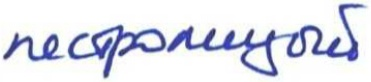пестролицый
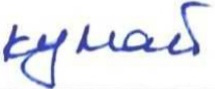кумай
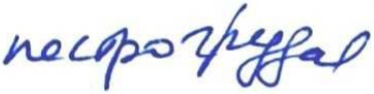построгрудая
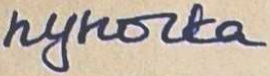пуночка
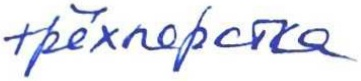трехпорстка
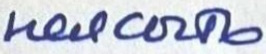неясыть
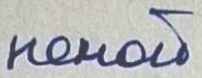немой
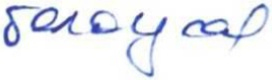белоусая
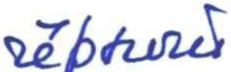чёрный
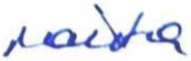майна
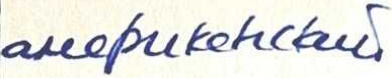америкенский
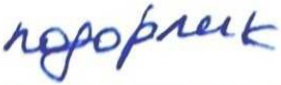подорлик
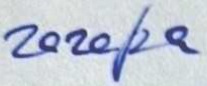гагара
